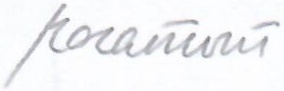рогатый
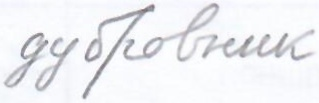дубровник
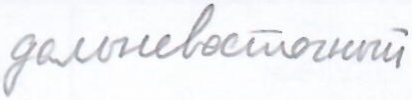дальневосточный
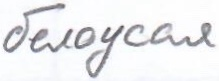белоусая
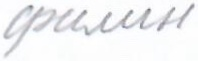филин
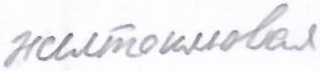желтоклювая
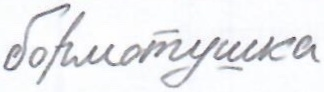бормотушка
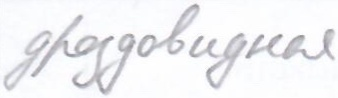дроздовидная
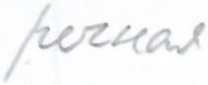речная
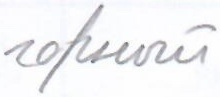горный
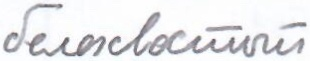белохвостый
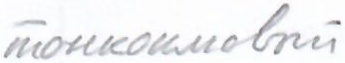тонкоклювый
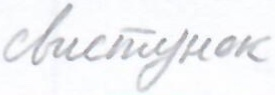свистунок
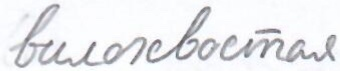вилохвостая
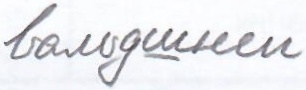вальдшнеп
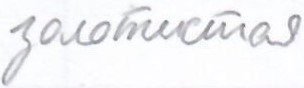золотистая
